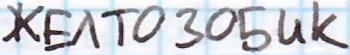желтозобик
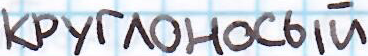круглоносый
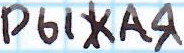рыжая
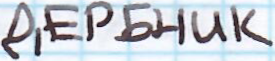дербник
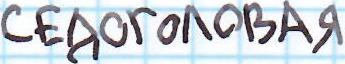седоголовая
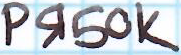рябок
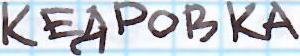кедровка
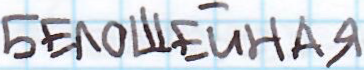белошейная
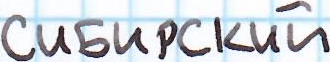сибирский
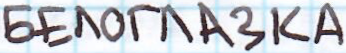белоглазка
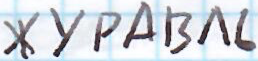журавль
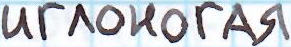иглоногая
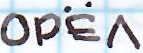орёл
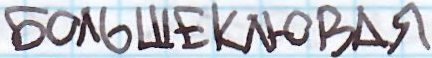большеклювая
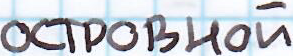островной
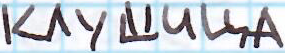клушица
